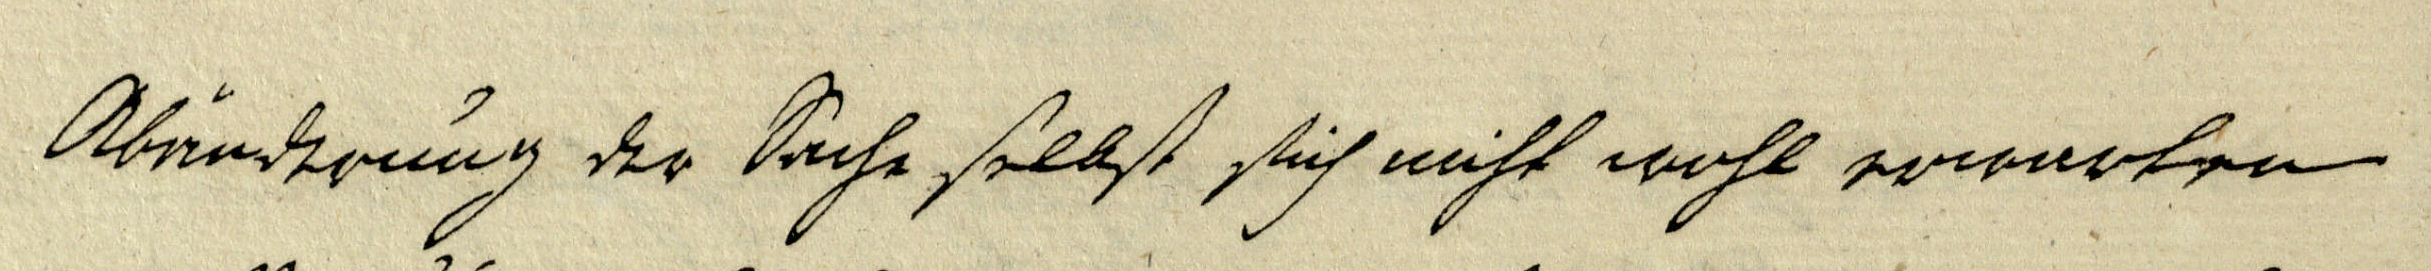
Abänderung der Sache selbst sich nicht wohl erwarten
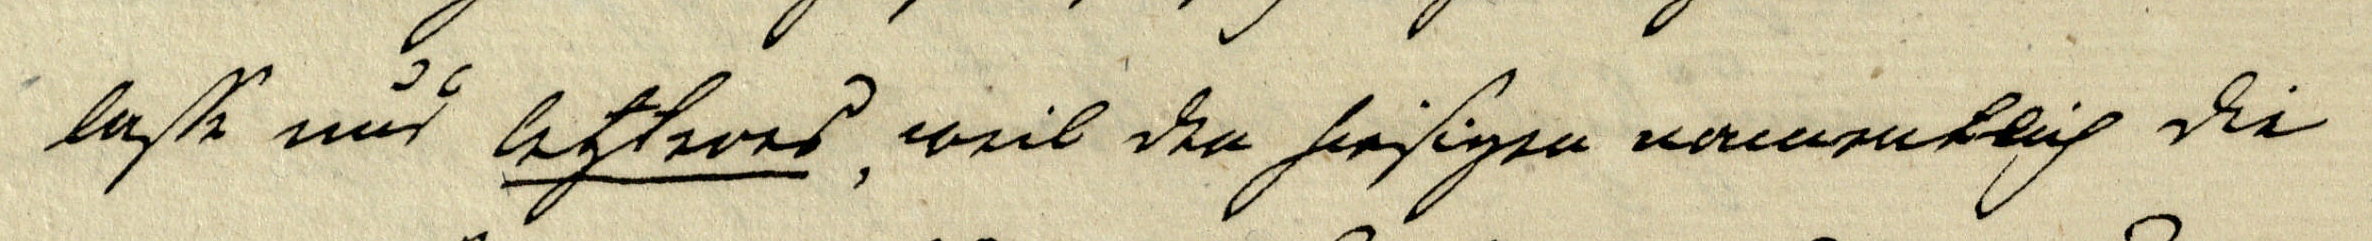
lasse und letzteres, weil der hiesigen namentlich die
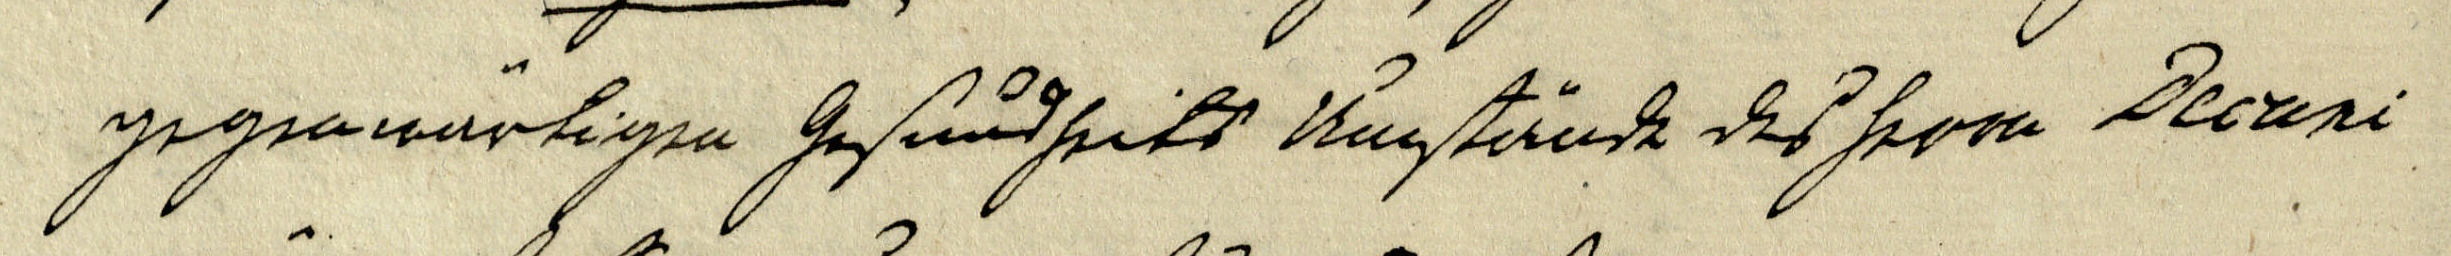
gegenwärtigen Gesundheits Umstände des Herrn Decani
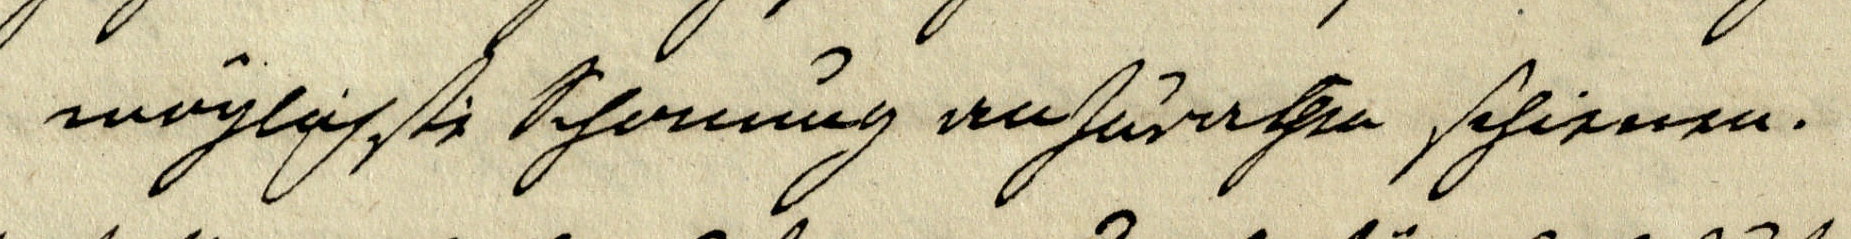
möglichste Schonung anzurathen schienen.
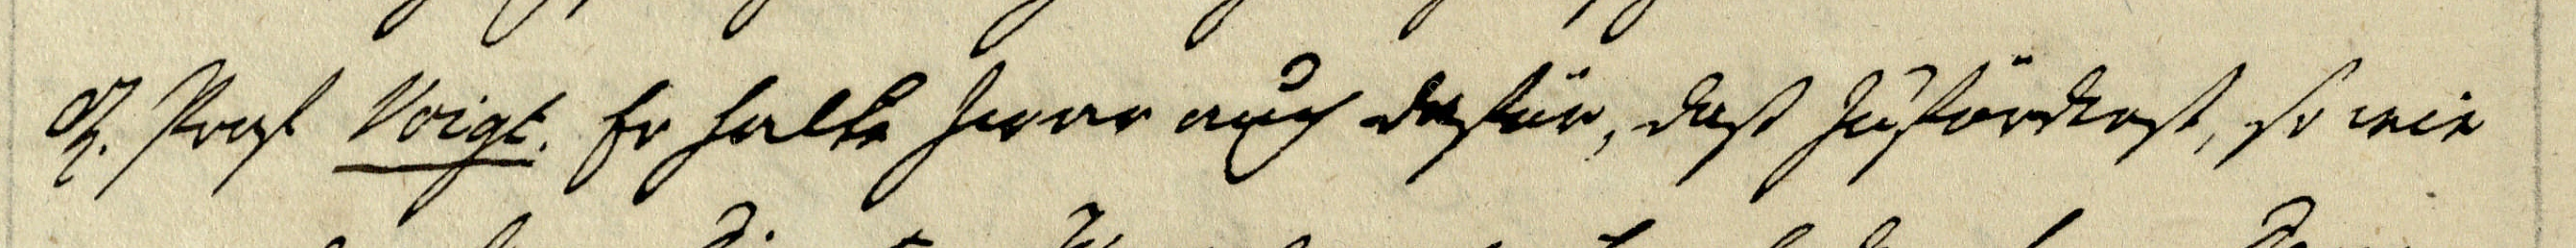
dh. Prof. Voigt. Er halte zwar auch dafür, daß zuförderst, so wie
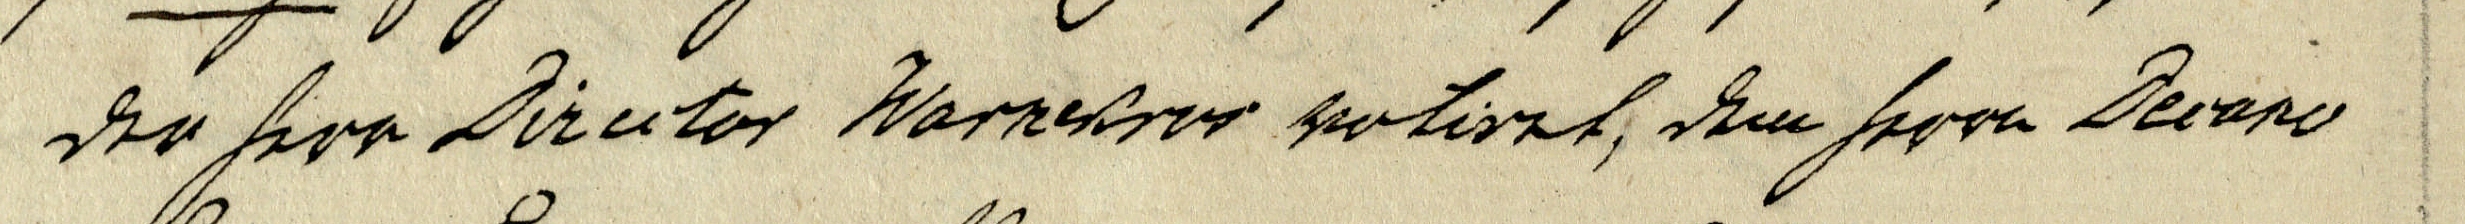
der Herr Director Warnekros votiret, dem Herrn Decano
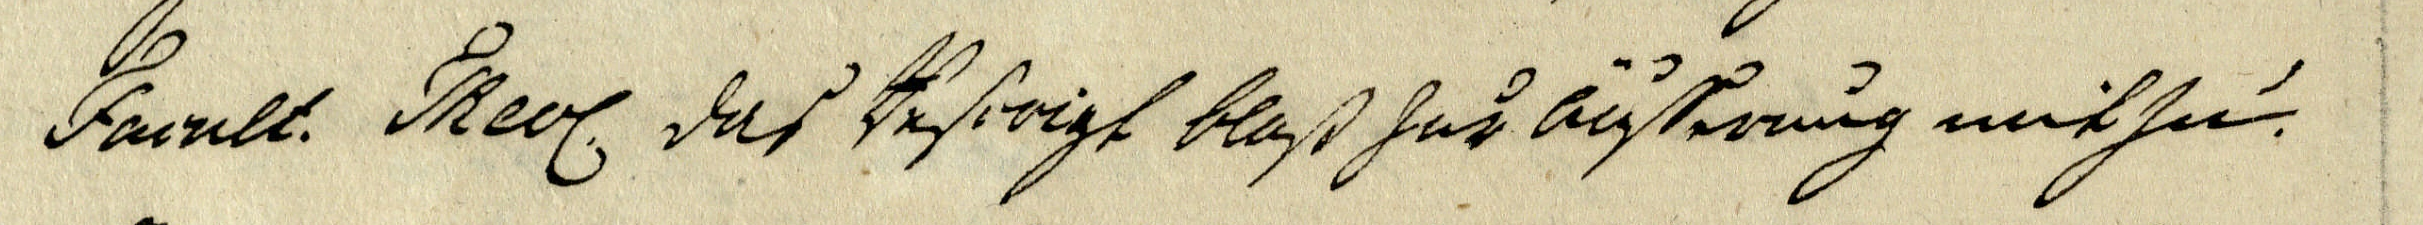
Facult. Theol. das Rescript bloß zur Äusserung mitzu¬
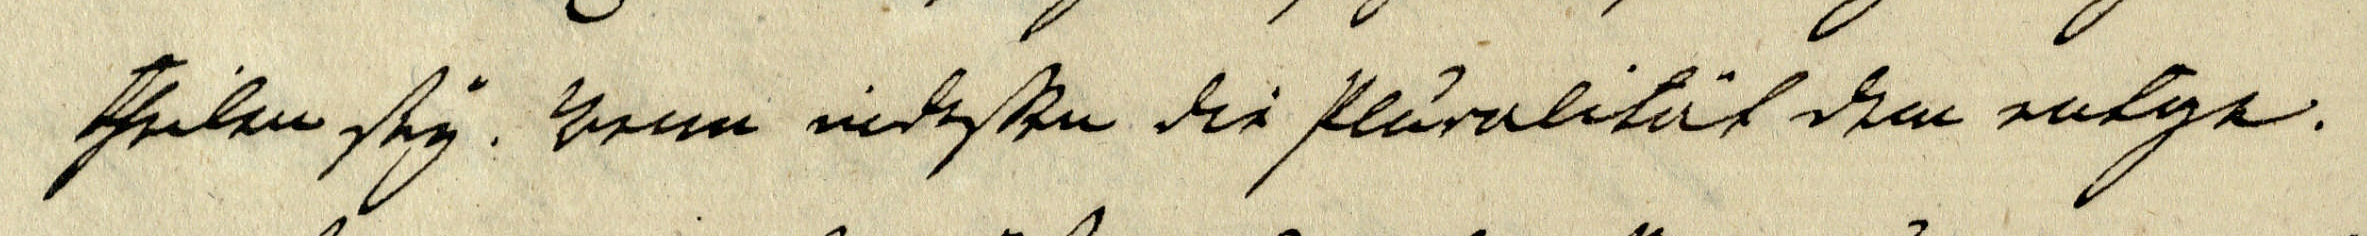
theilen seÿ. Wenn indessen die Pluralität dem entge¬
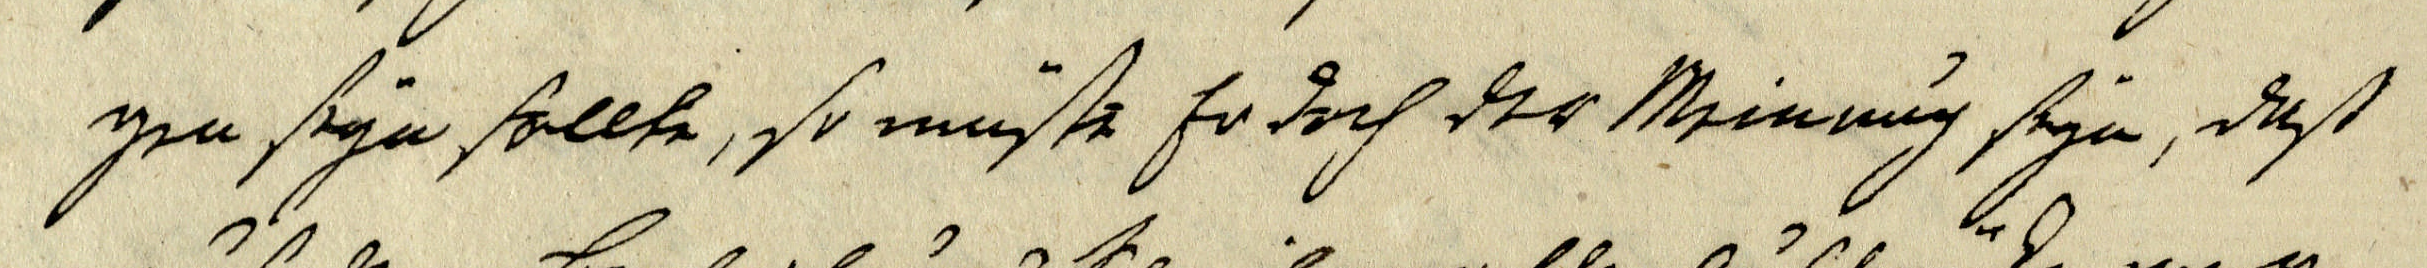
gen seÿn sollte, so müsse Er doch der Meinung seÿn, daß
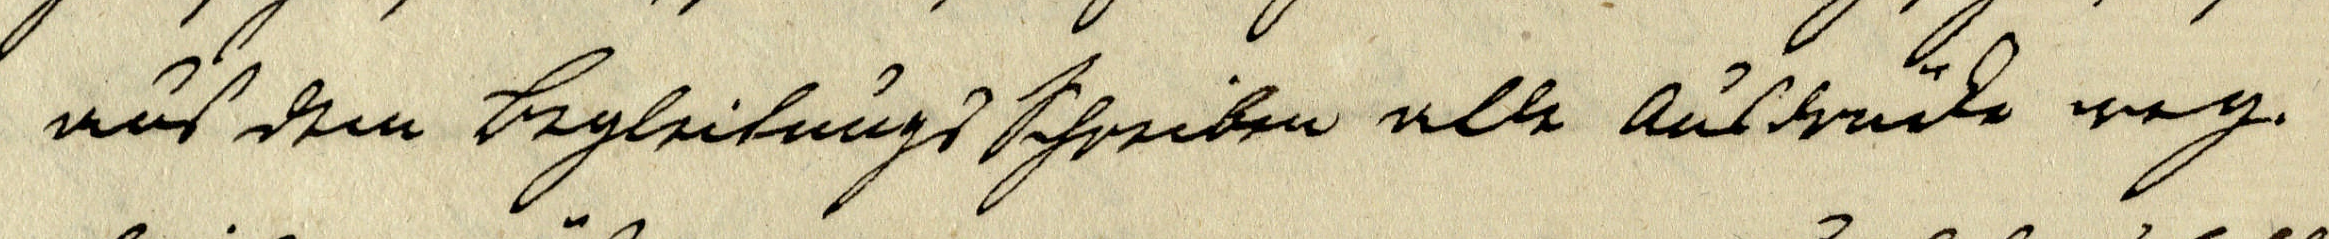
aus dem Begleitungs Schreiben alle Ausdrücke weg¬
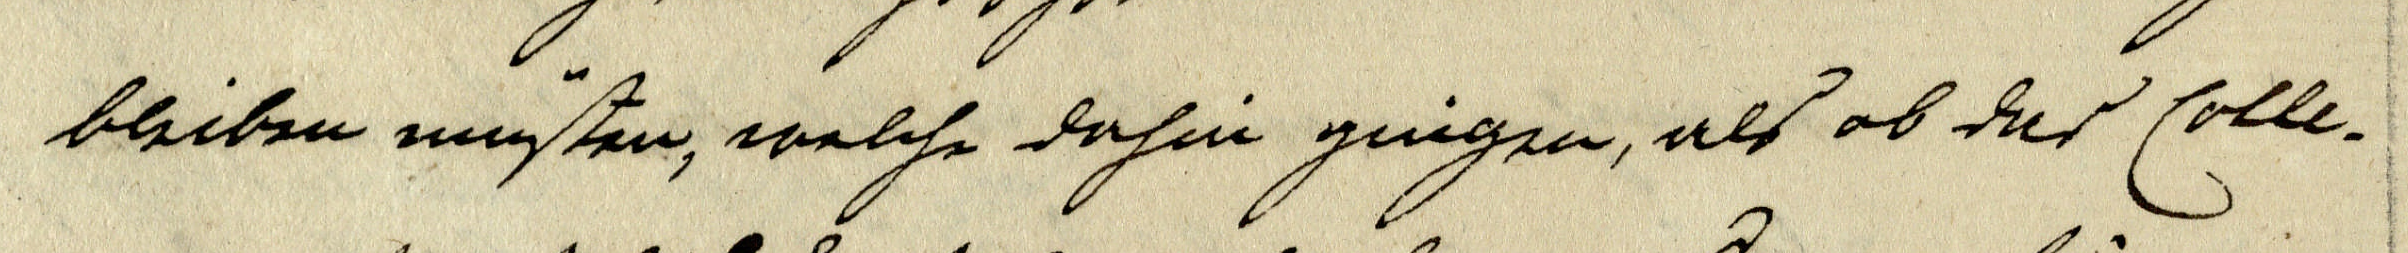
bleiben müßten, welche dahin gingen, als ob das Colle¬
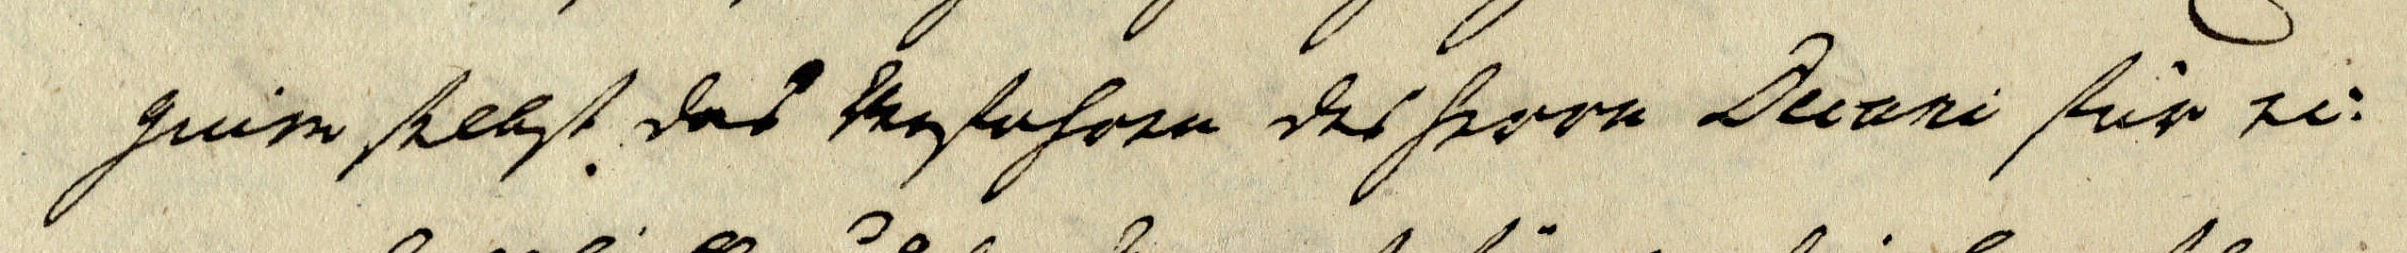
gium selbst das Verfahren des Herrn Decani für ei¬
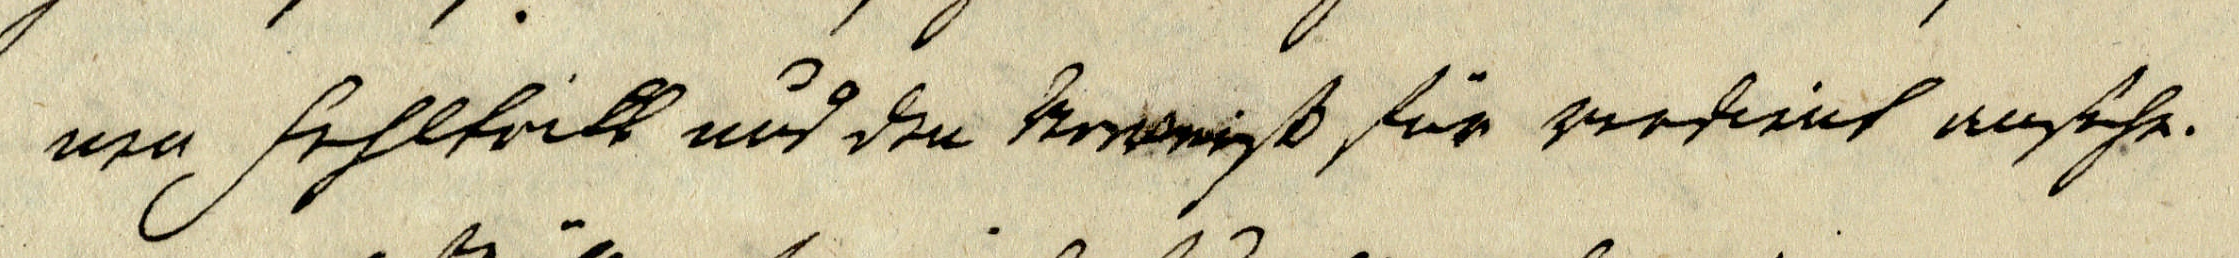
nen Fehltritt und den Verweiß für verdient ansehe.
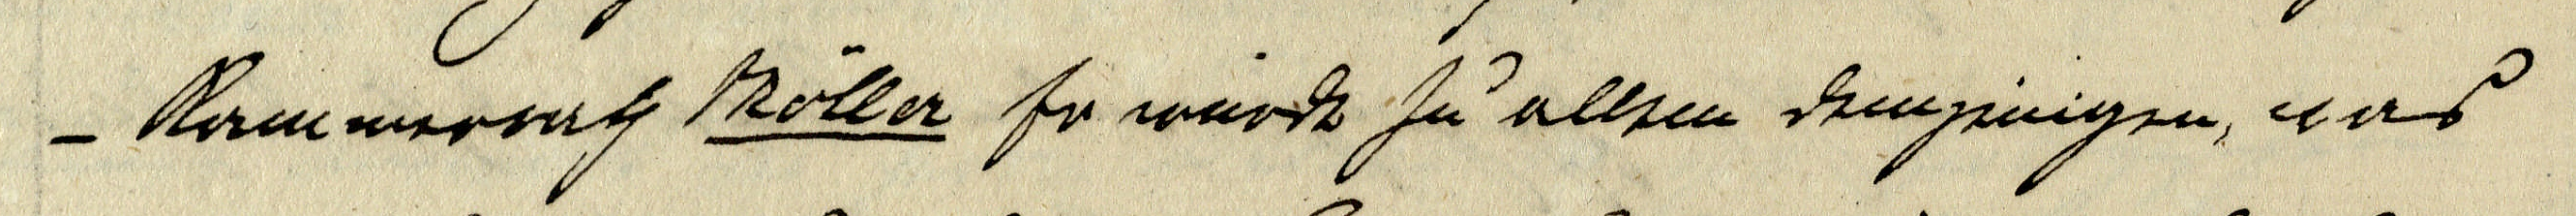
Kammerrath Möller Er würde zu allem demjenigen, was
